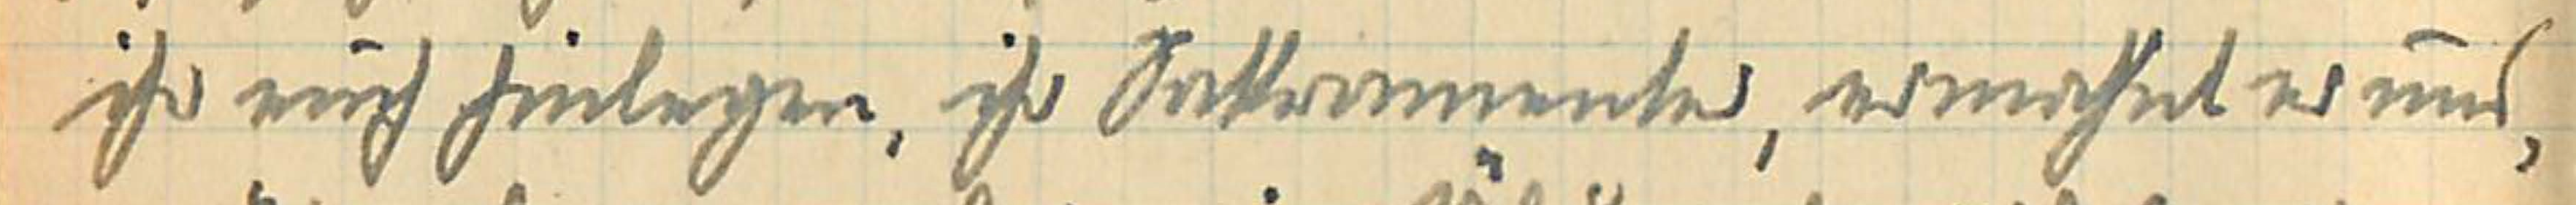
ihr euch hinlegen, ihr Sakramenter, ermahnt er uns,
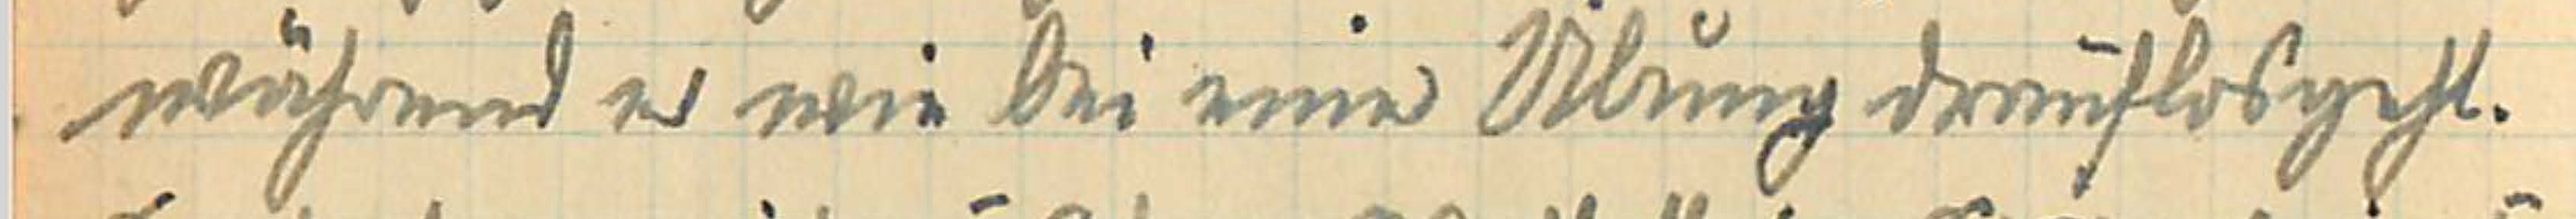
während er wie bei einer Übung drauflosgeht.
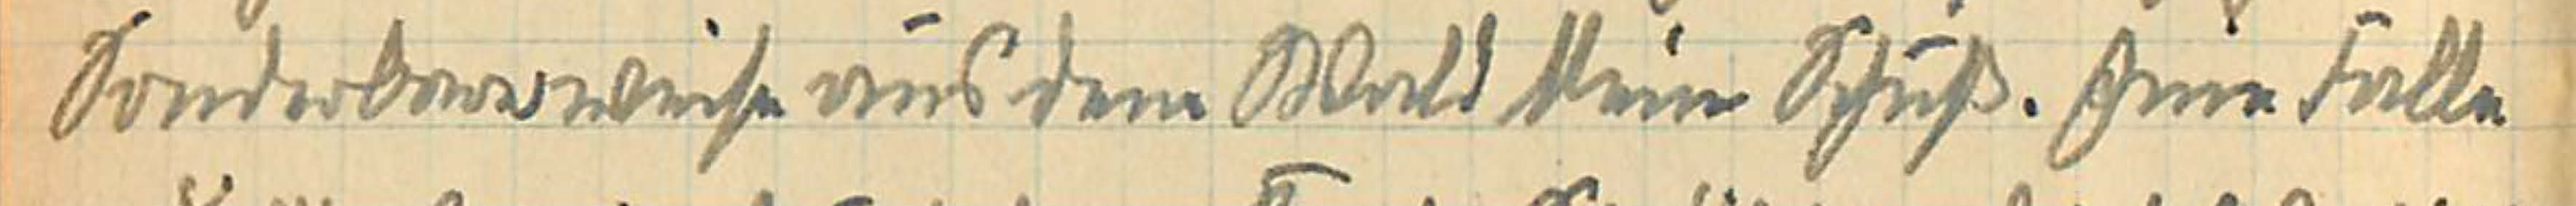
Sonderbarerweise aus dem Wald kein Schuß. Eine Falle
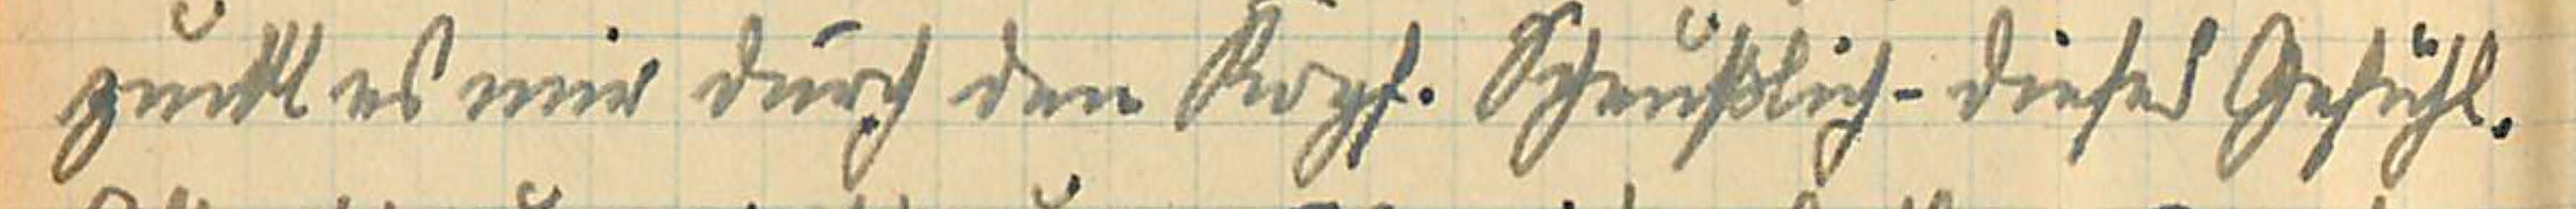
zuckt es mir durch den Kopf. Scheußlich – dieses Gefühl.
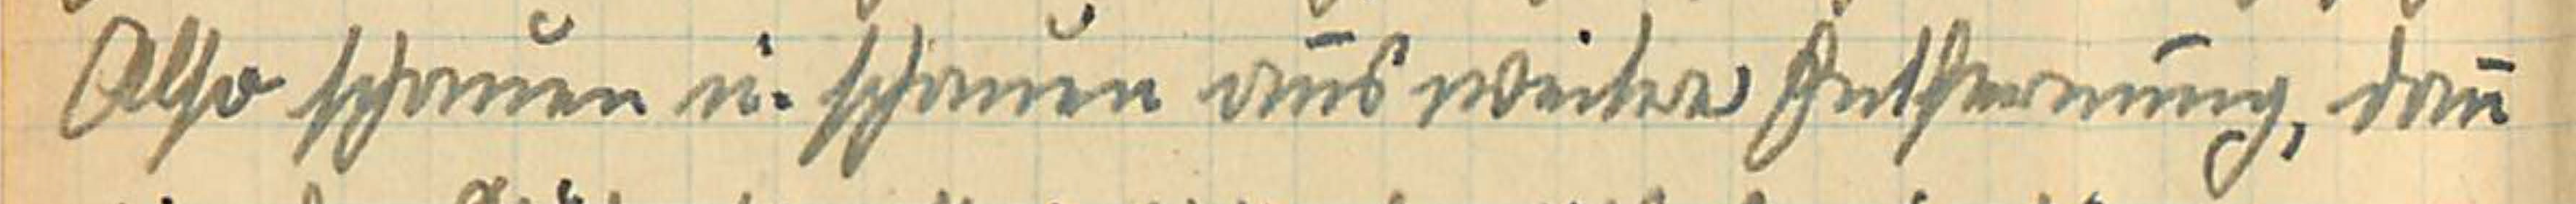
Also schauen u. schauen aus weiter Entfernung, dann
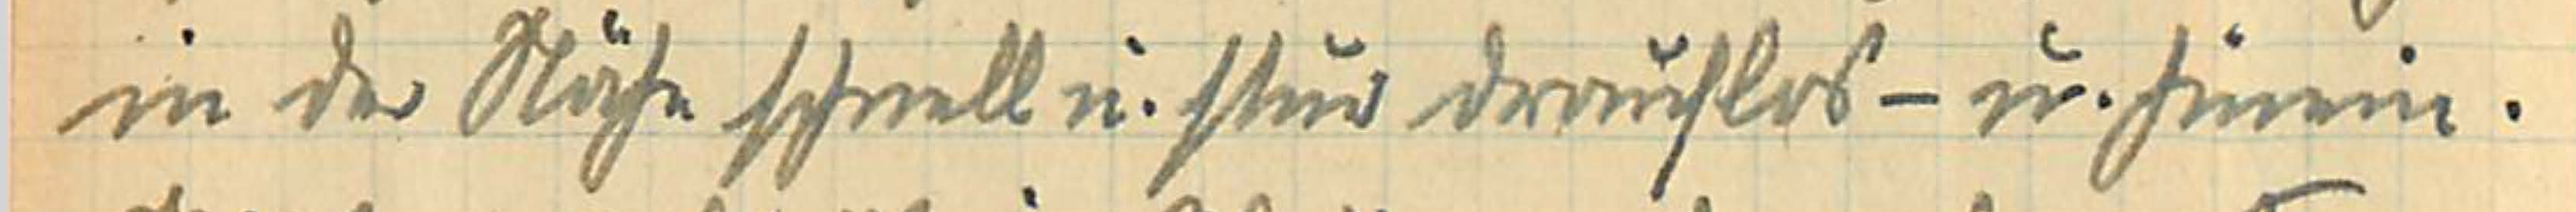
in der Nähe schnell u. stur drauflos – u. hinein.
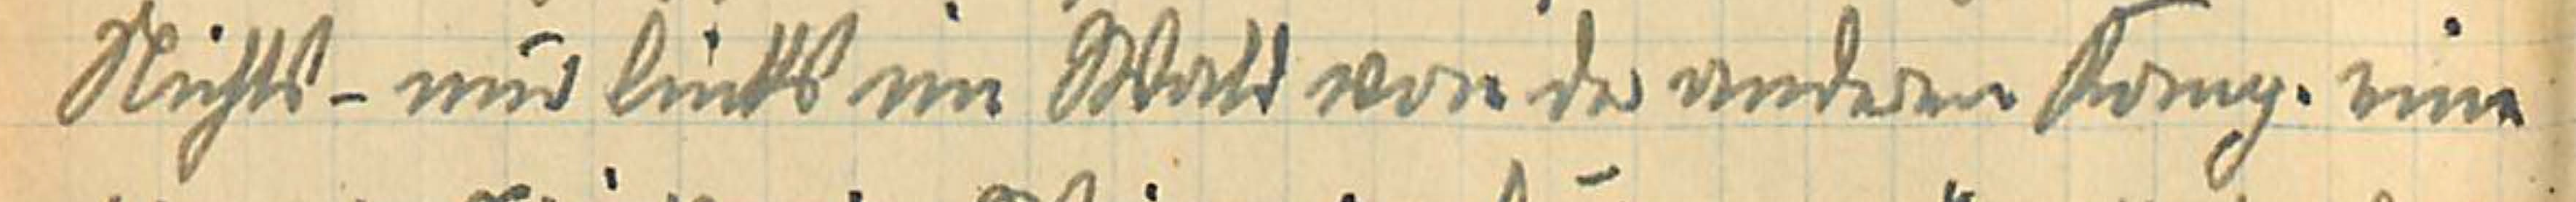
Nichts – nur links im Wald von der anderen Komp. eine
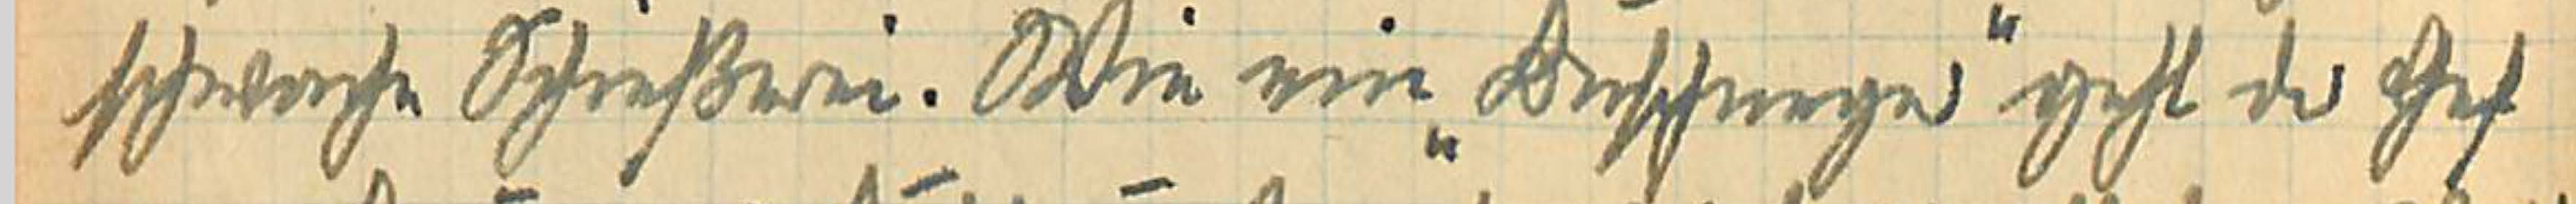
schwache Schießerei. Wie ein "Buschneger" geht der Chef
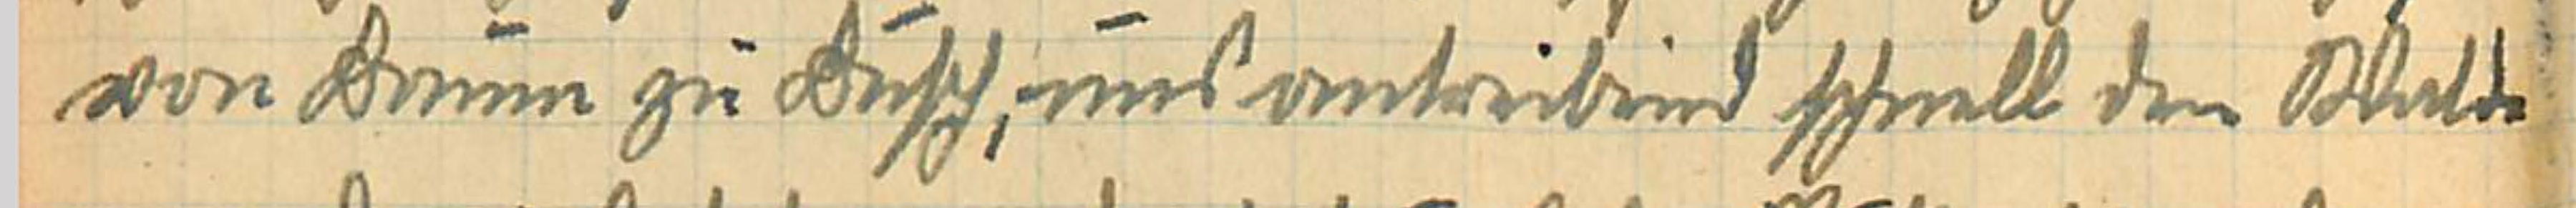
von Baum zu Busch, uns antreibend schnell den Wald-
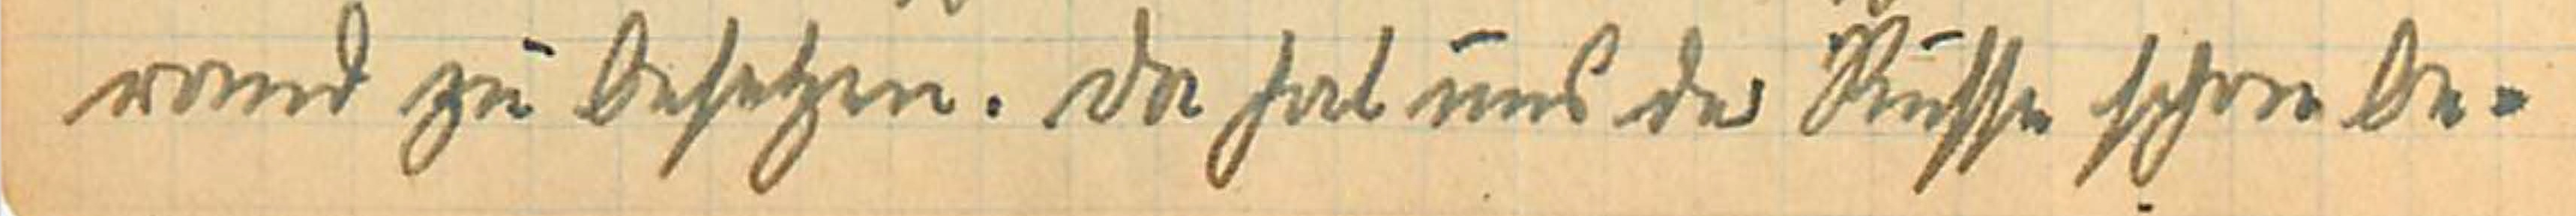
rand zu besetzen. Da hat uns der Russe schon be-
